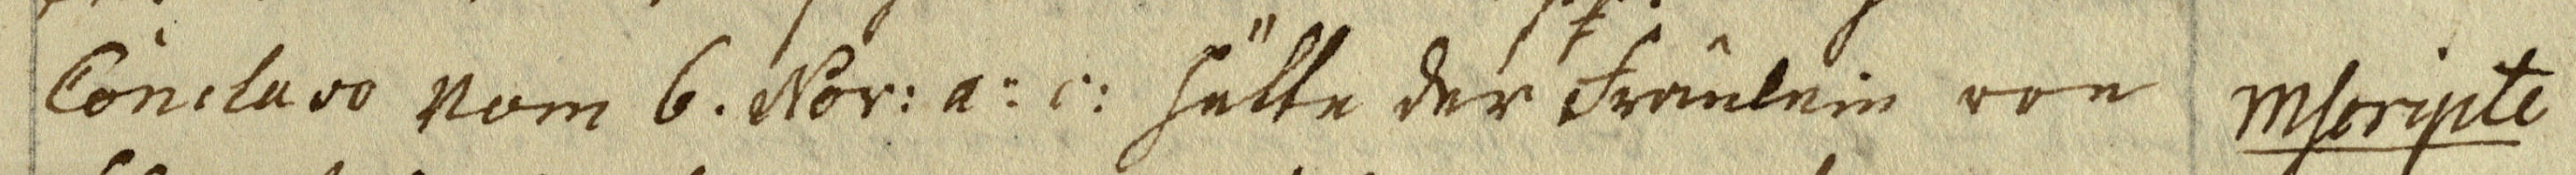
Concluso vom 6. Nov. a. c. hätte der Fräulein von
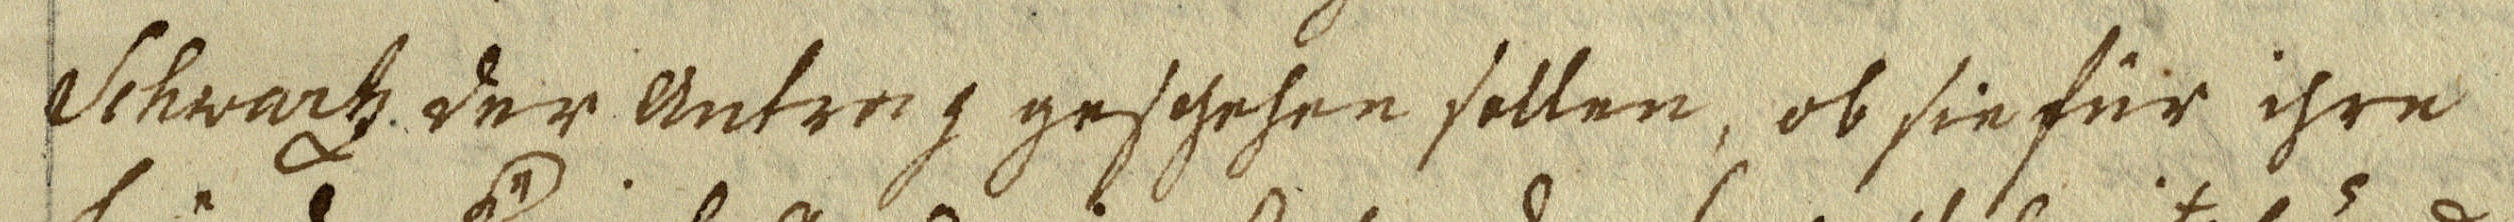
Schwartz der Antrag geschehen sollen, ob sie für ihre
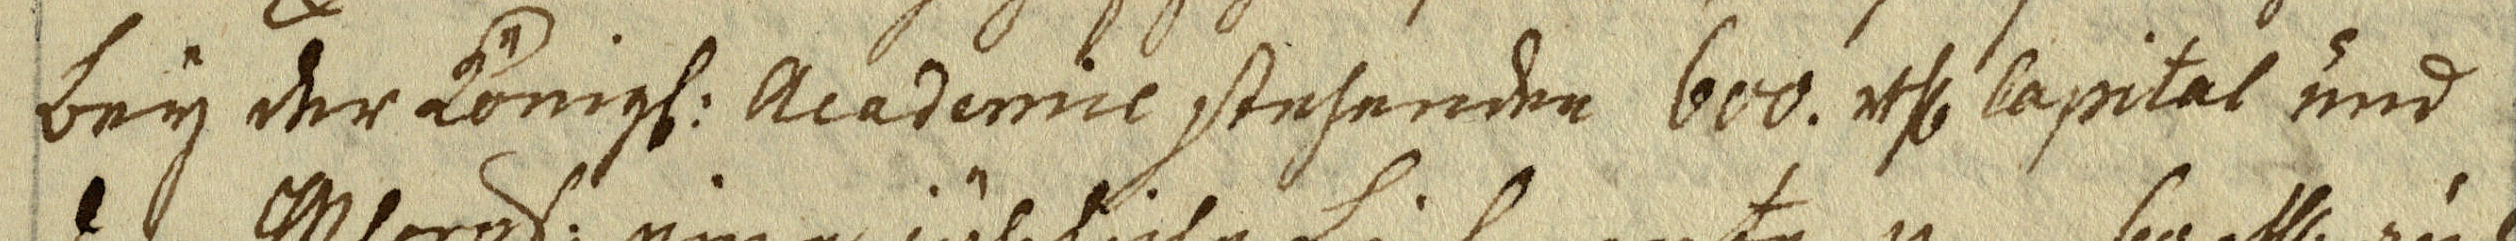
beÿ der Königl. Academie stehenden 600rtl. Capital und
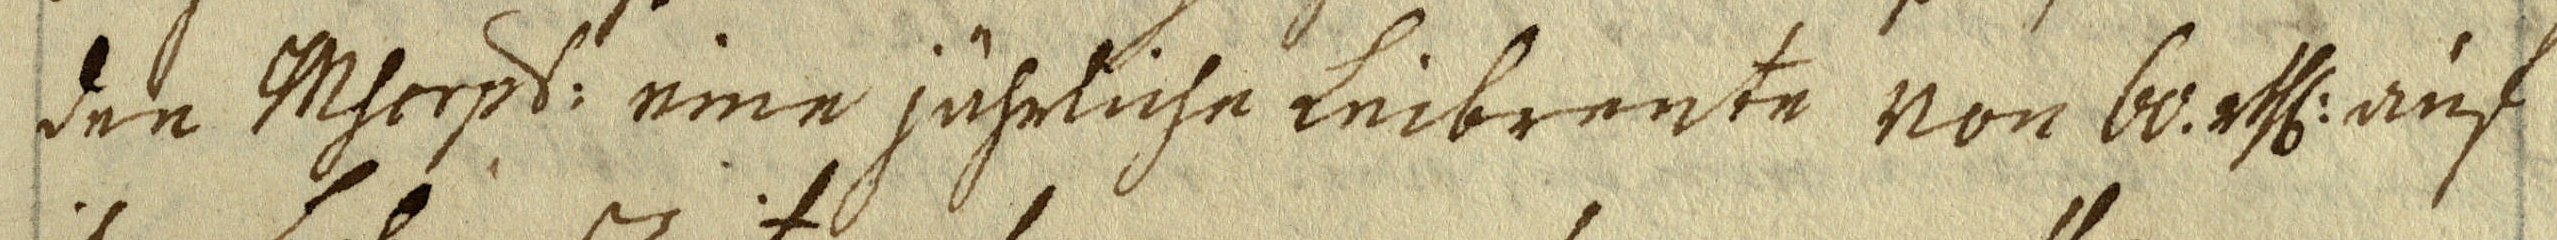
den Mscrpt. eine jährliche Leibrente von 60 rtl. auf
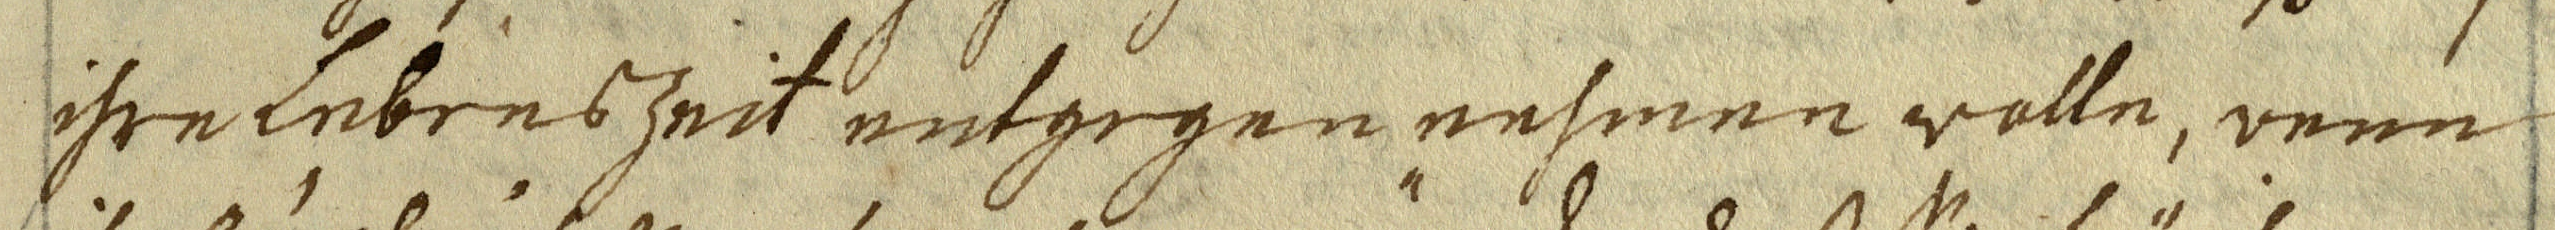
ihre Lebenszeit entgegen nehmen wolle, wenn
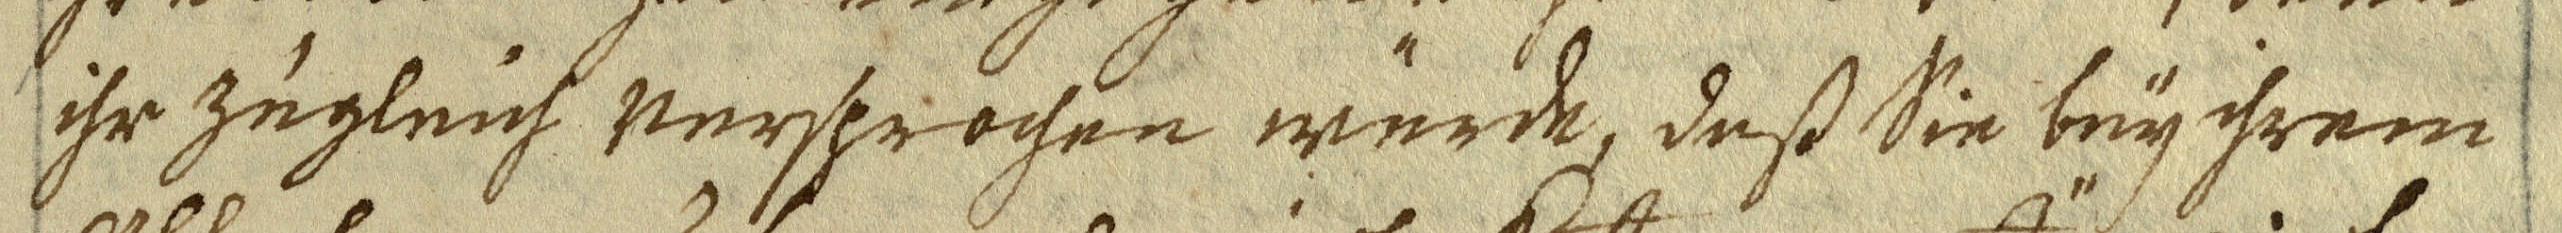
ihr zugleich versprochen würde, daß Sie beÿ ihrem
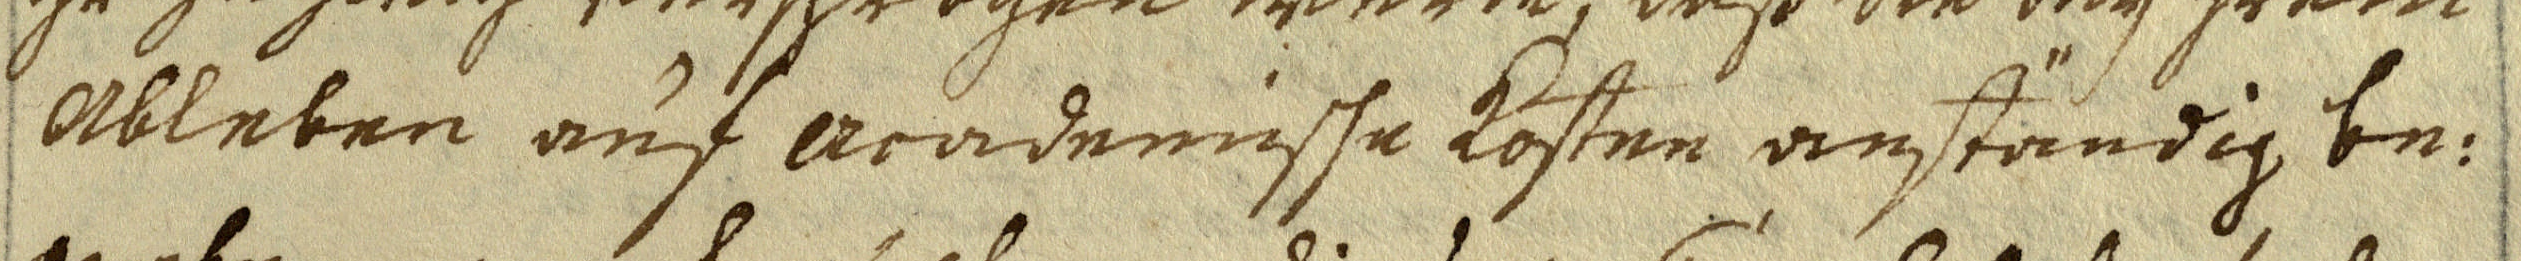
Ableben auf academische Kosten anständig be¬
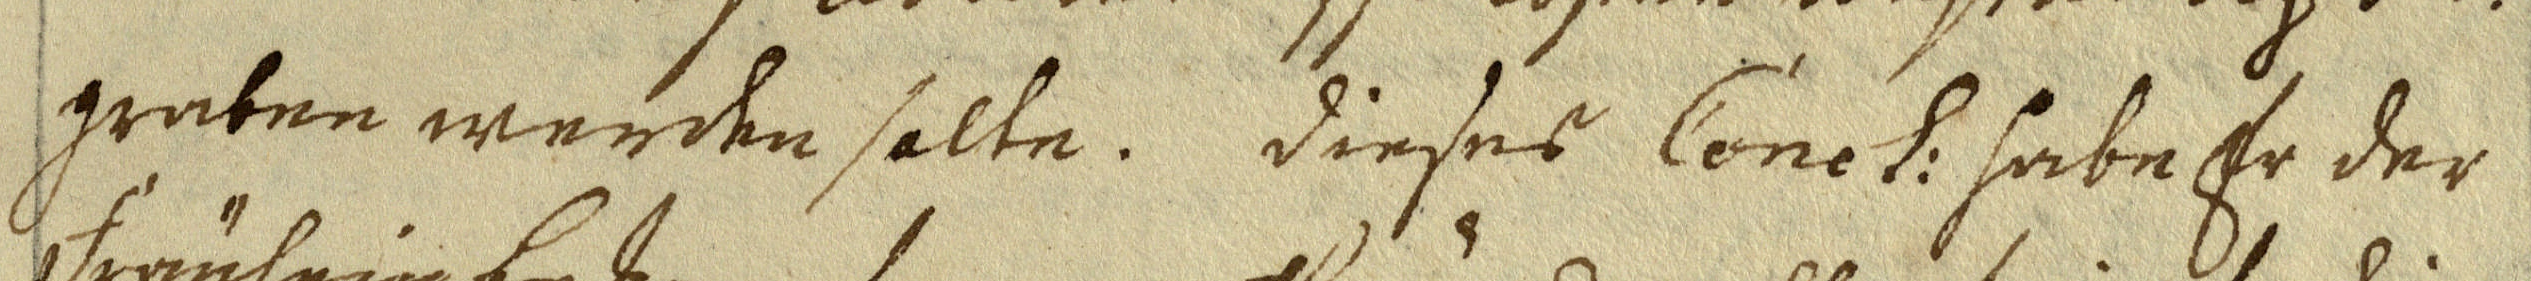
graben werden solte. Dieses Concl. habe Er der
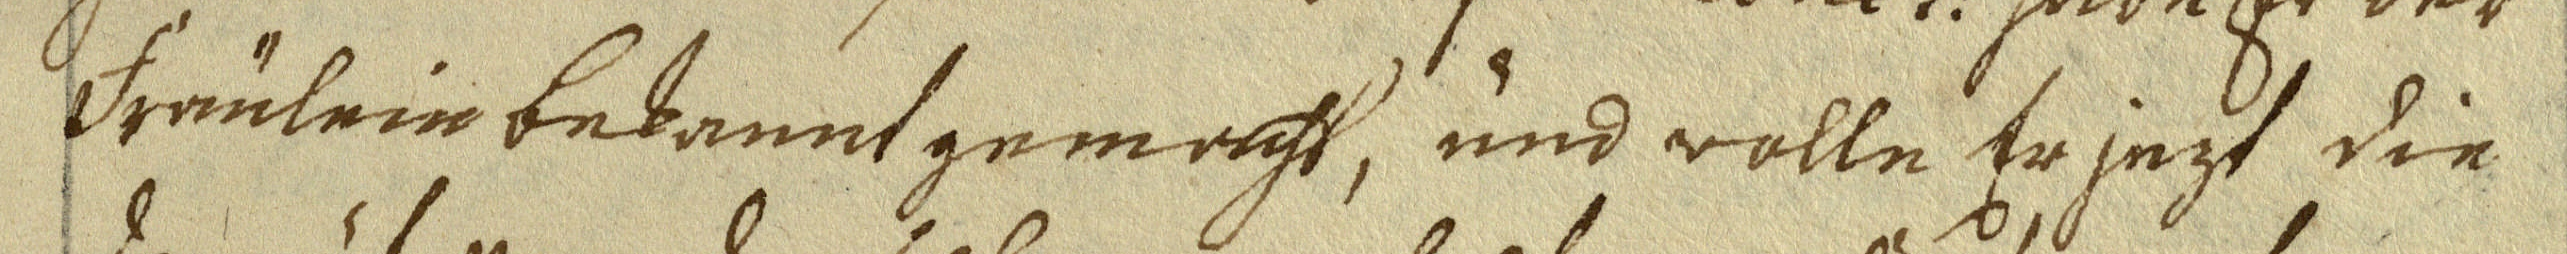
Fräulein bekannt gemacht, und wolle Er jezt die
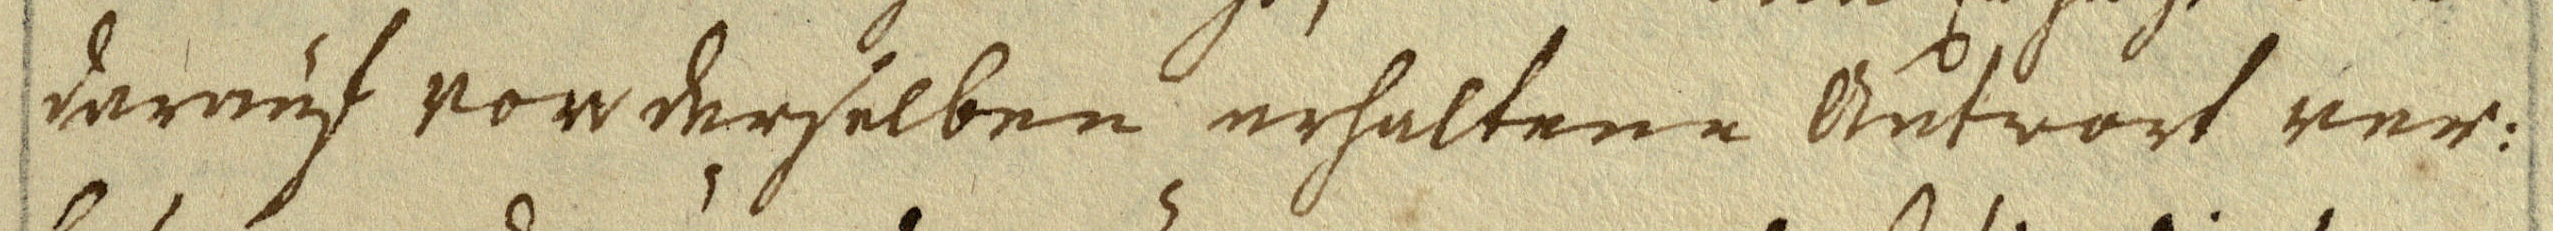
darauf von derselben erhaltene Antwort ver¬
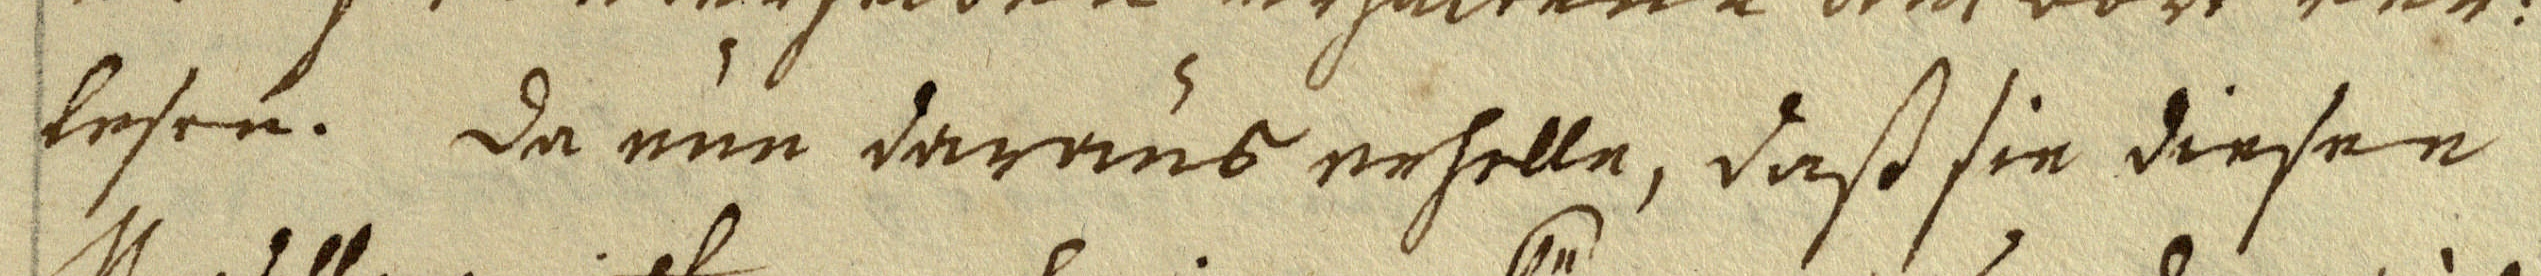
lesen. Da nun daraus erhelle, daß sie diesen
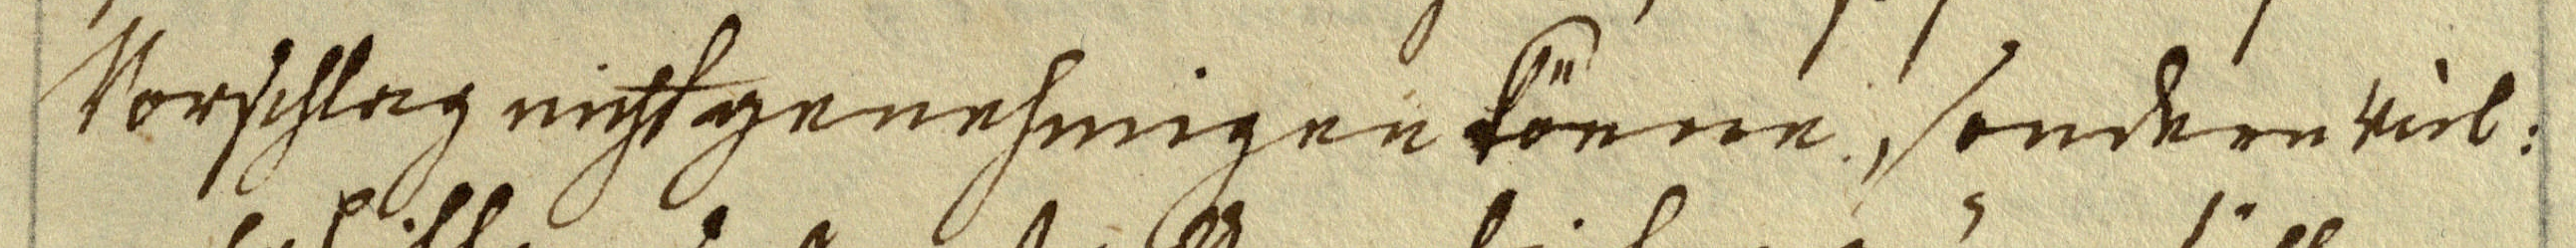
Vorschlag nicht genehmigen könne, sondern viel¬
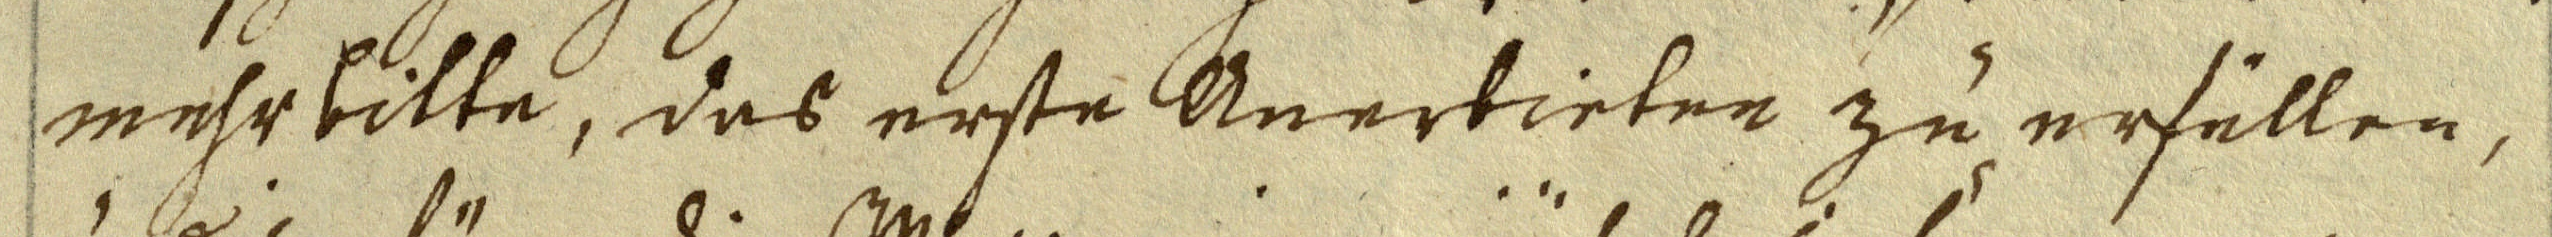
mehr bitte, das erste Anerbieten zu erfüllen,
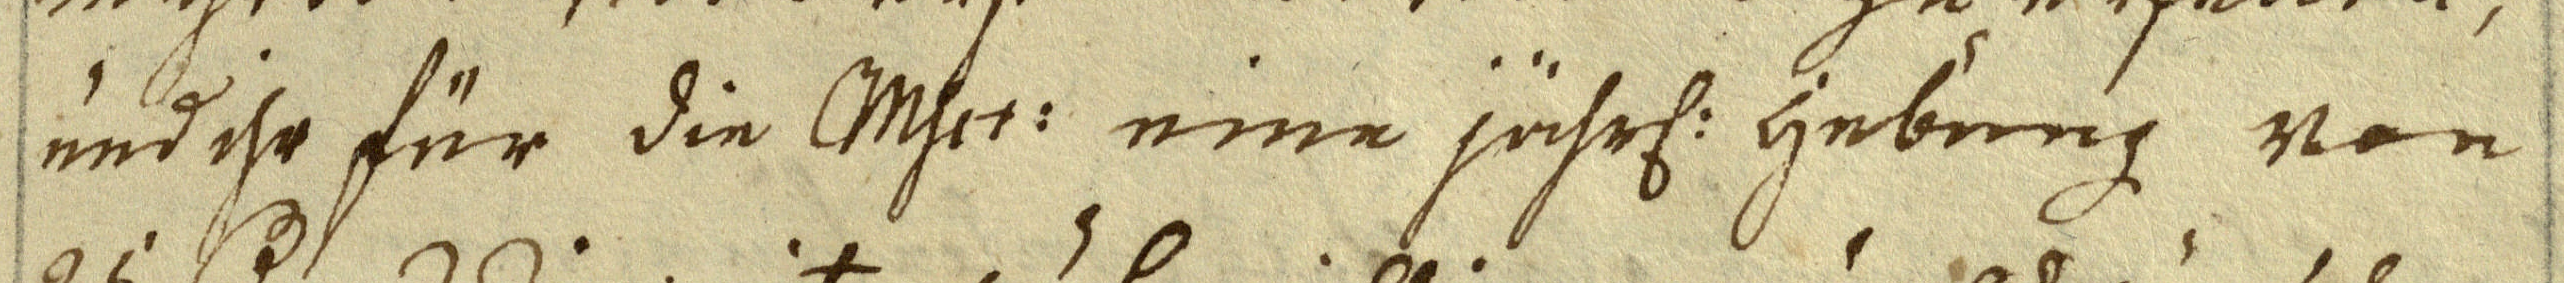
und ihr für die Mscr. eine jährl. Hebung von
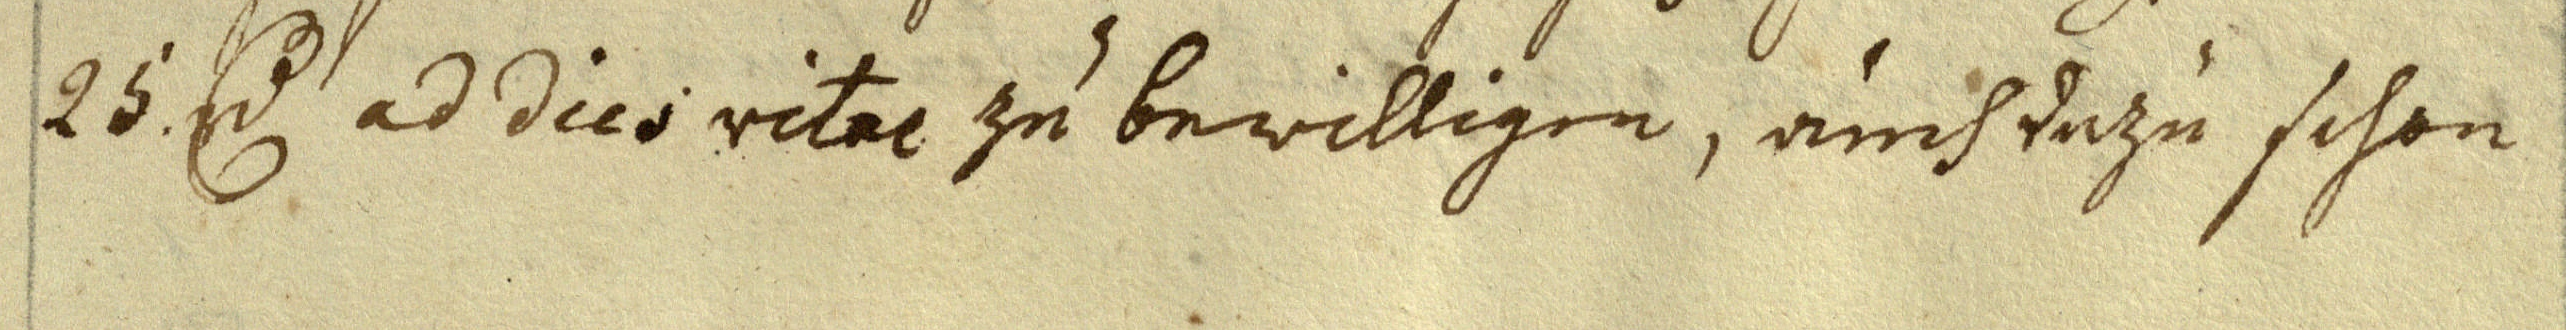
25 rd. ad dies vitae zu bewilligen, auch dazu schon
